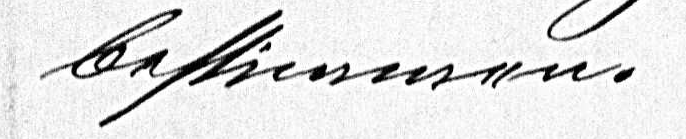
bestimmen.
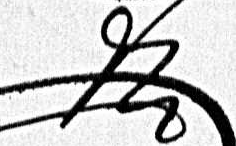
FJ
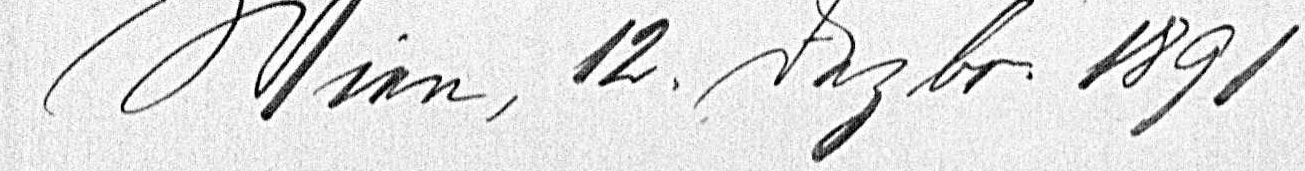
Wien, 12. Dezbr 1891
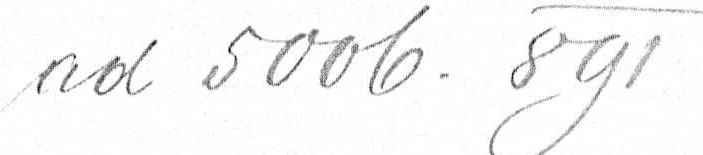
ad 5006 1891
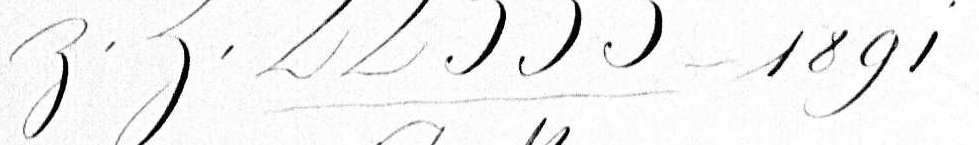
z Z. 22335 – 1891/
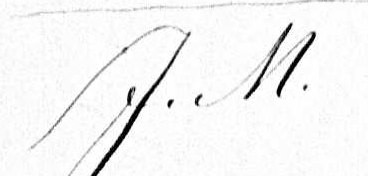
JM
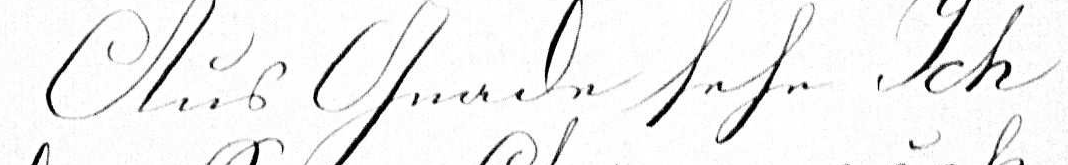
Aus Gnade sehe Ich
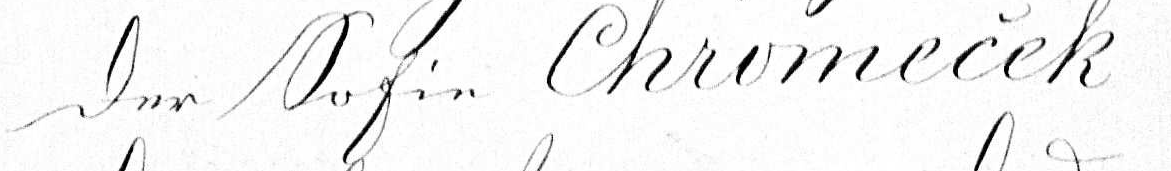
der Sofie Chromeček
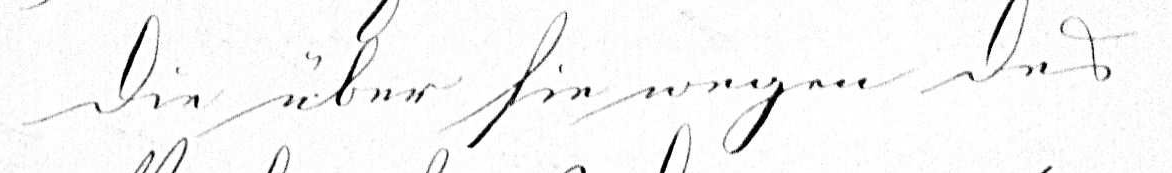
die über sie wegen
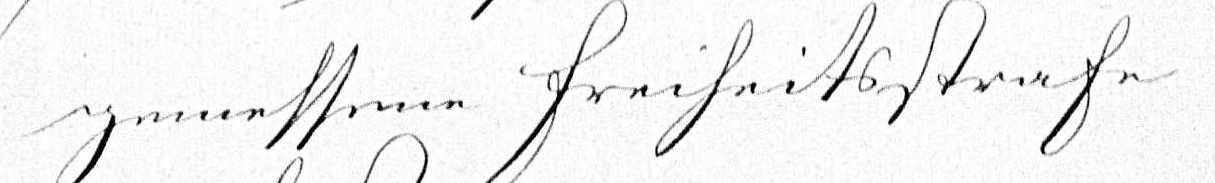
gemessene Freiheitsstrafe
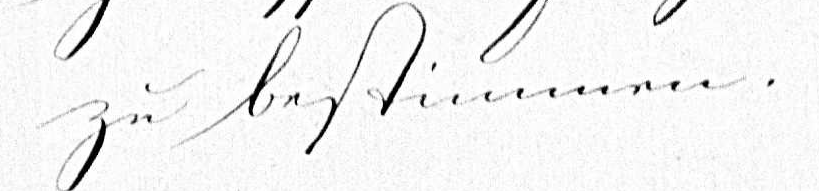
zu bestimmen.
